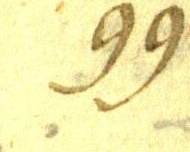99
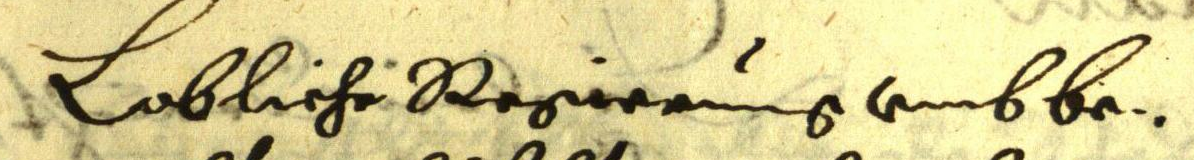Lobliche Regierūng vmb be¬
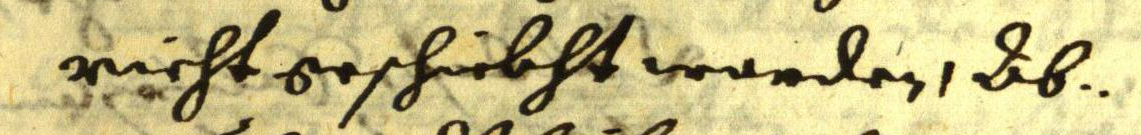richt geschickht worden, Abge¬
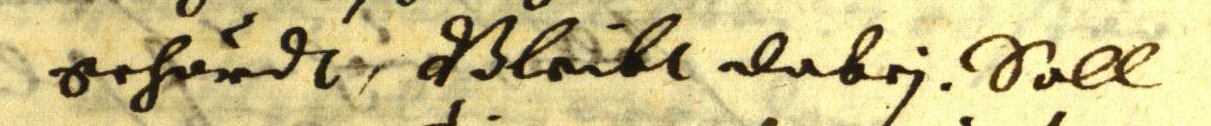hōrdt, Bleibt dabej. Soll
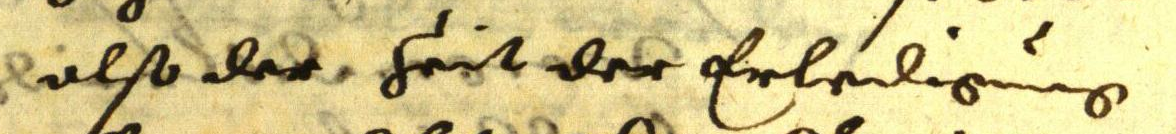also der Zeit der Erledigūng
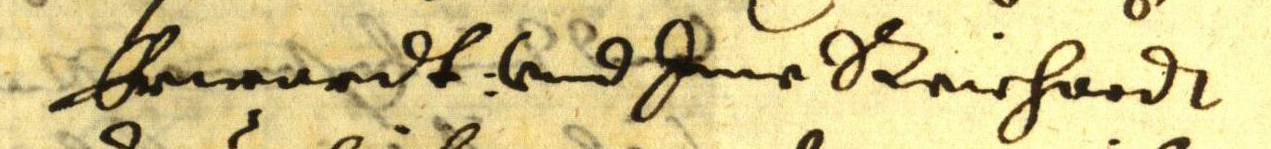Erwardt: vnd Ime Reichardt
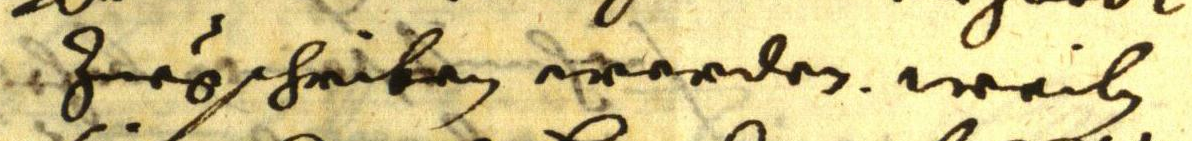Zūegschriben werden. weiln
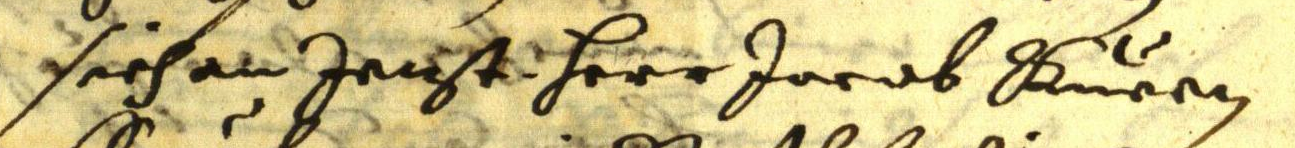sich an Jezt herr Jacob Kūeen
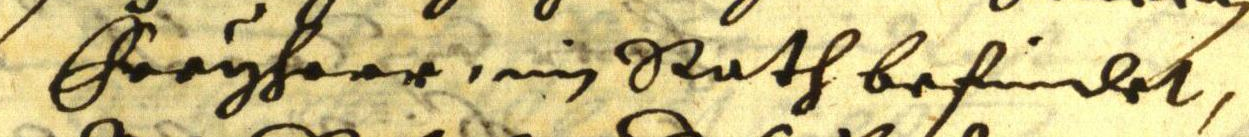Freȳherr, im Rath befindet,
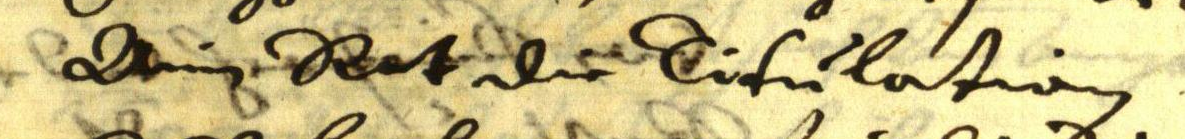Aim Rat die Titūlation
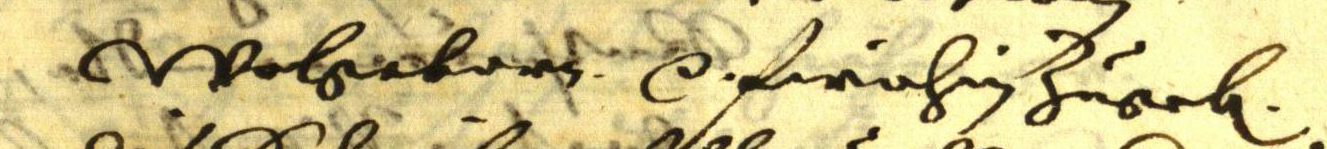Wolgeborn etc. firohin Zūgeb.
